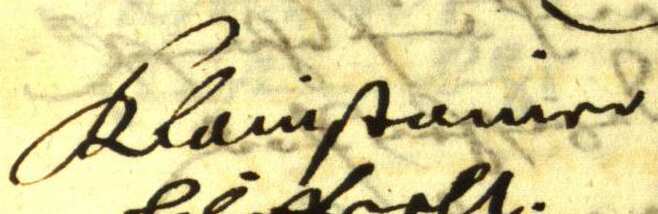Klainstainer
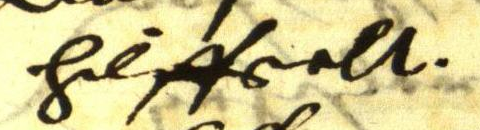hilffgelt.
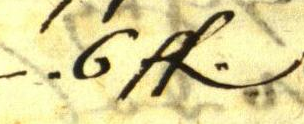—. 6 fl.
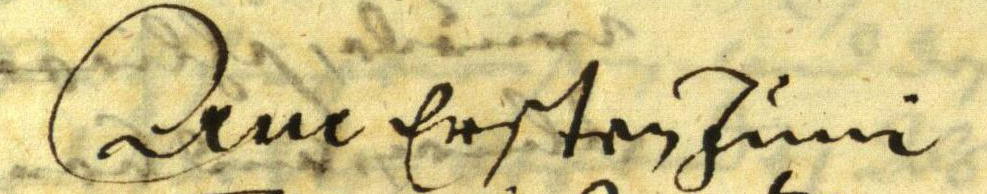Am Ersten Jūni
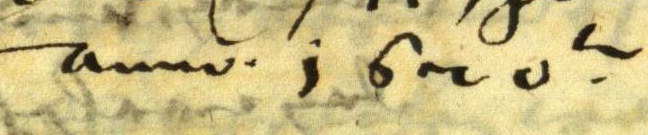Anno .1620.t
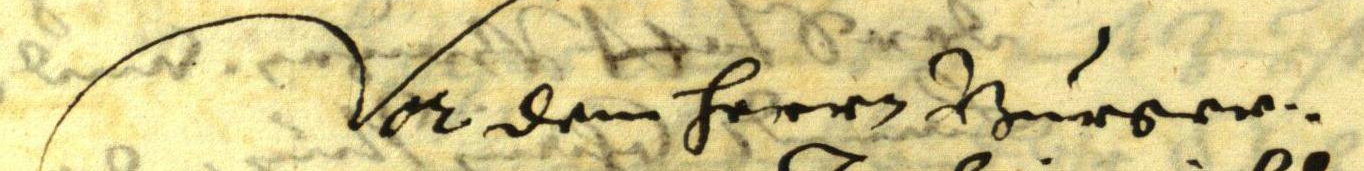Vor dem herrn Būrger¬
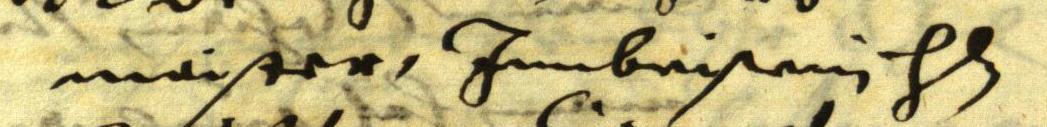maister, Innbeisein hln
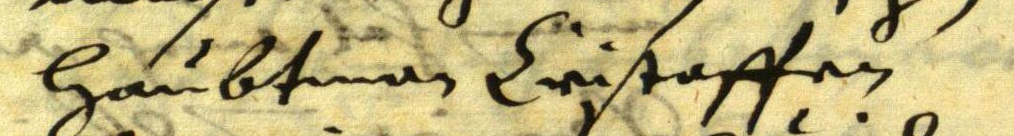Haūbtman Cristoffen
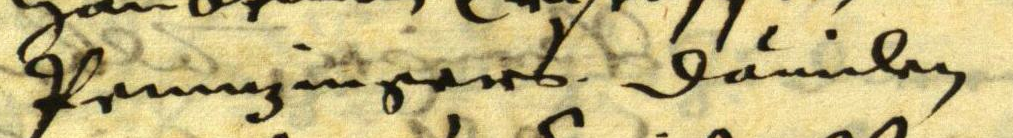Pennzingers. Daūiden
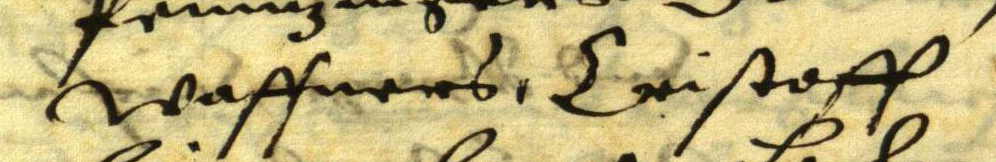Waffners, Cristoff
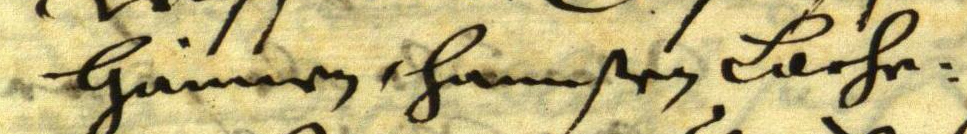Haimen, hannsen Loche¬
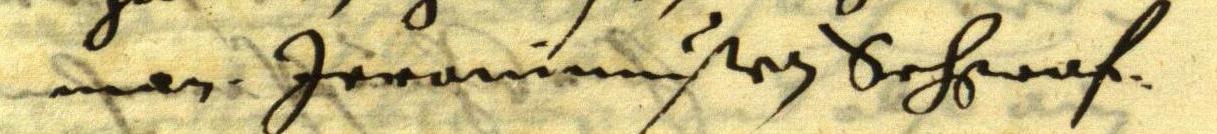man. Jeronimūsen Schgraf¬
